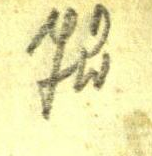72
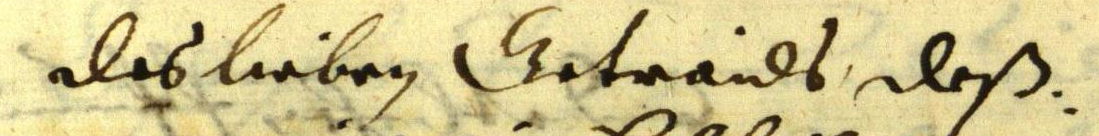des lieben Getraids deß¬
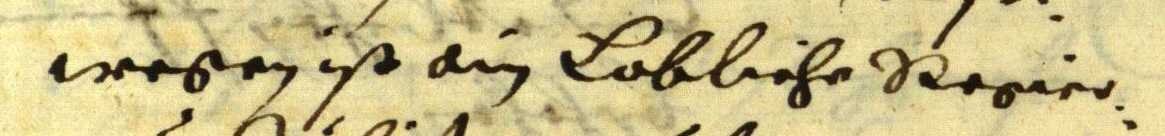wegen ist ain Lobliche Regier¬
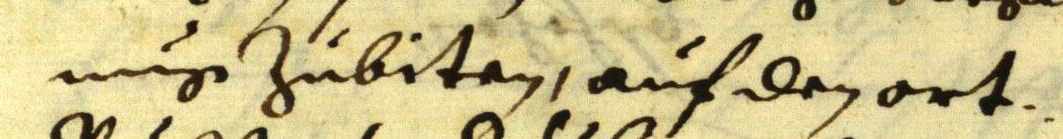ūng Zūbiten, aūf den ort¬
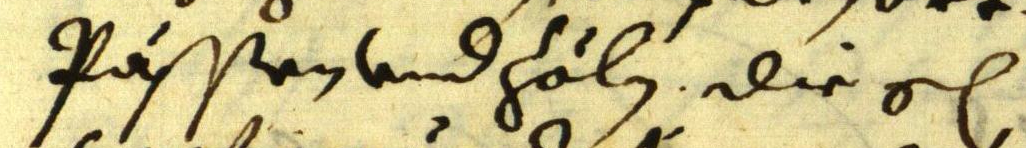Pāssen und Zōln. die g:
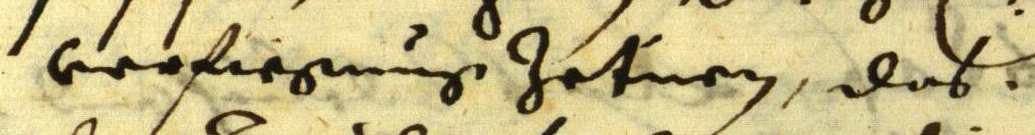verfiegūng Zetūen, das.
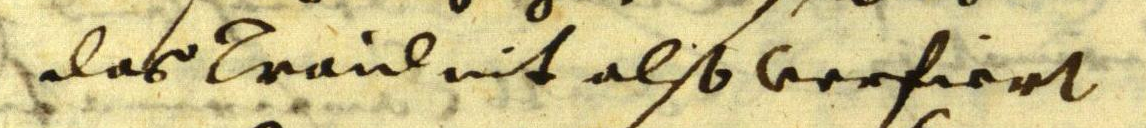das Traid nit also verfiert
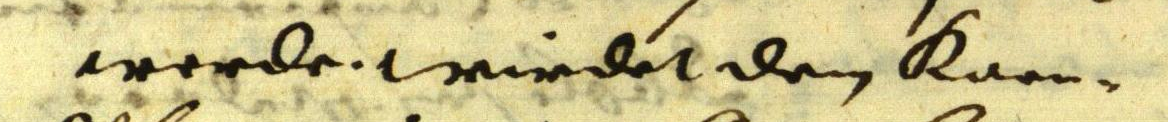werde. wirdet dem Korn¬
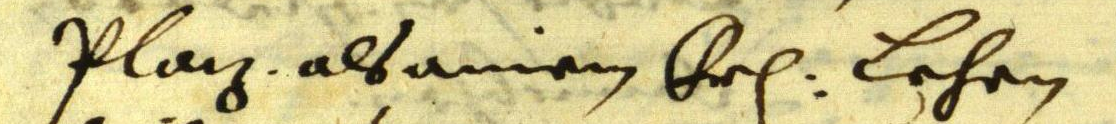Plaz. als ainem Frl: Lehen
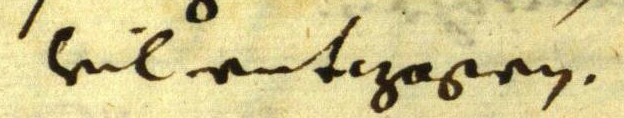vil entzogen.
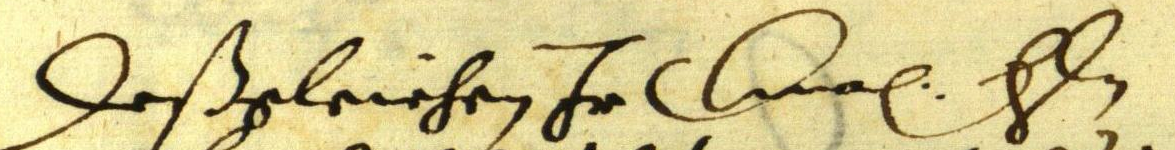Deßgleichen Ir Gn: hln
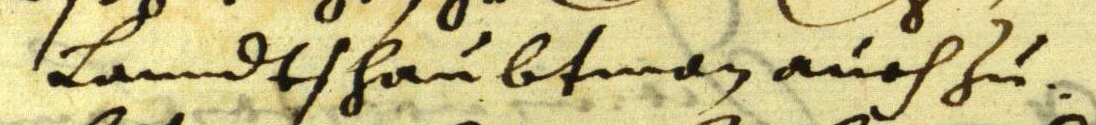Lanndtshaūbtman aūch Zū¬
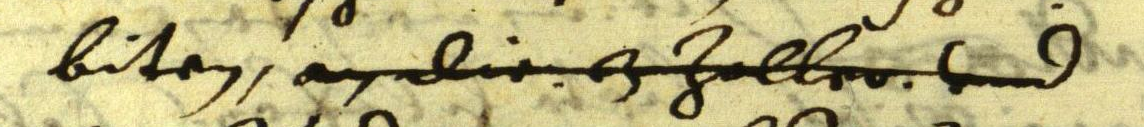Biten, an die .3 Zeller. vnd
